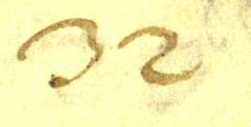32
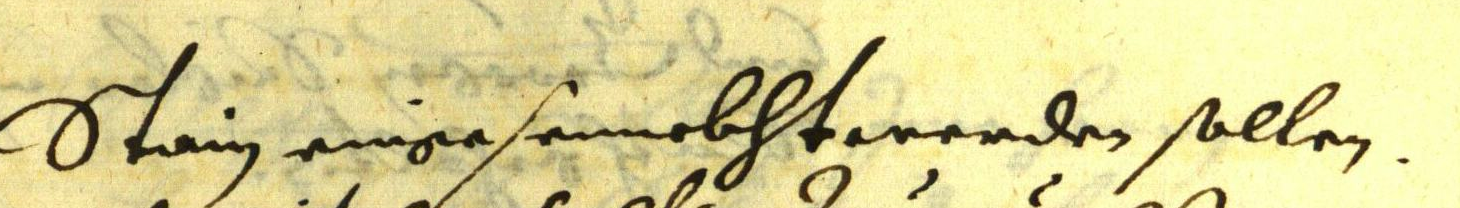Stain eingesennckht werden sollen.
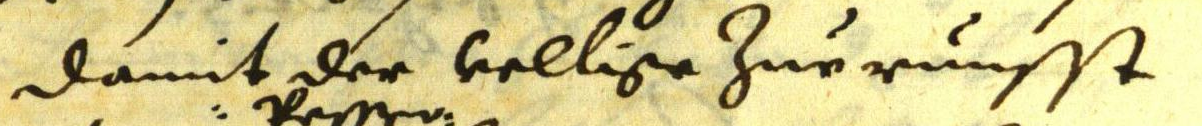damit der vellige Zūe rūnsst
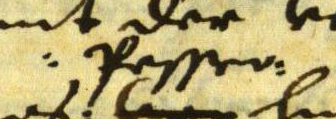Pesser
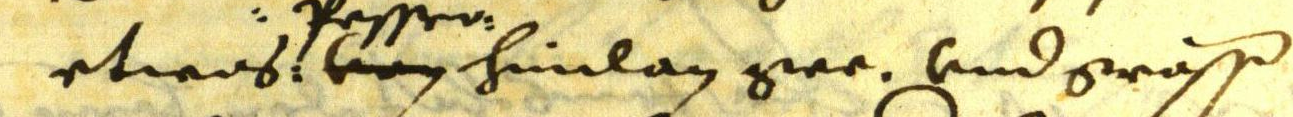etwas von hindan gee. vnd gross
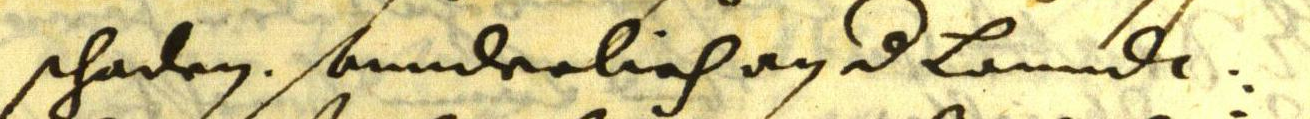schaden. sonderlich an d Lanndt¬
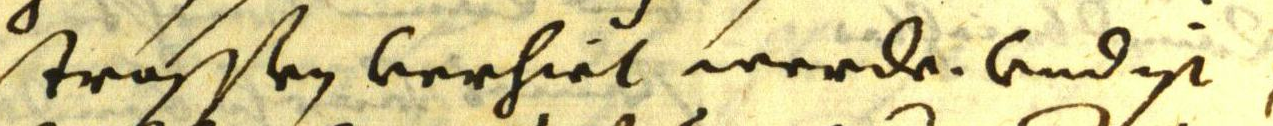strassen verhiet werde. vnd ist
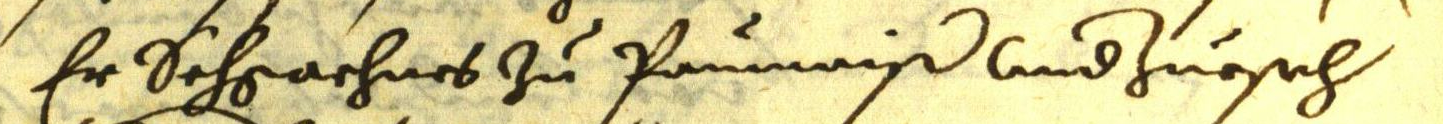Er Schgachnes Zū Paūmaist vnd Zūeseh
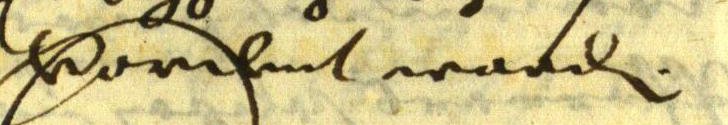Vordent word.
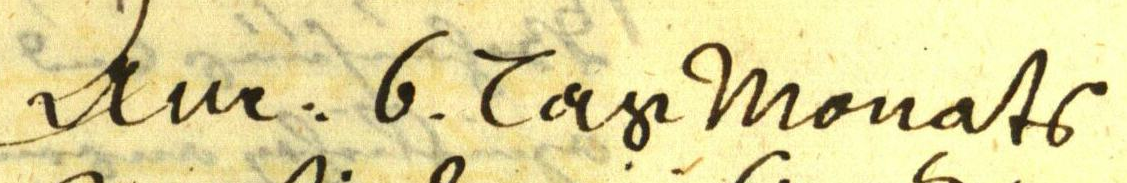Am: 6. Tag Monats
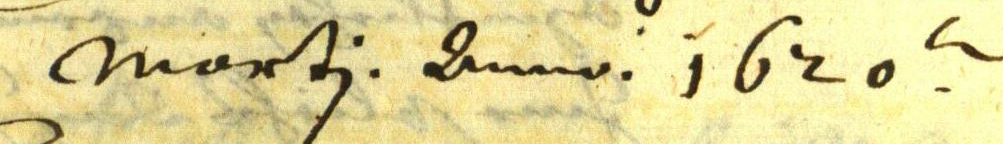Martj. Anno. 1620 t.
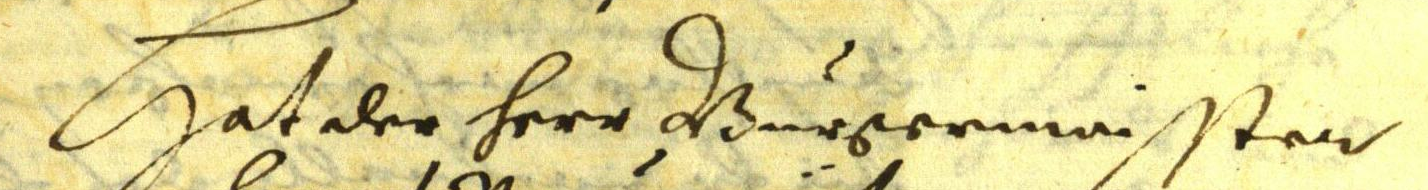Hat der herr Būrgermaisster
